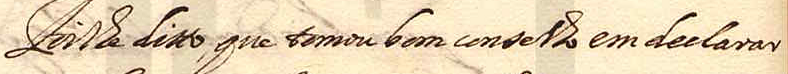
Foilhe ditto que tomou bom conselho em declarar
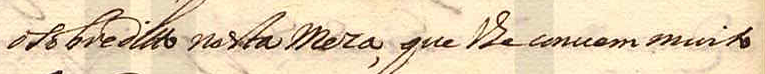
o sobreditto nesta Meza, que lhe conuem muito
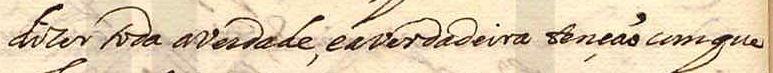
dizer toda a verdade, e a verdadeira tençaõ com que
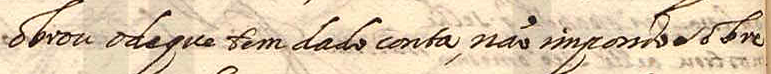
obrou o de que tem dado conta, naõ impondo sobre
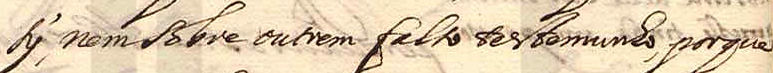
sy nem sobre outrem falso testemunho, porque
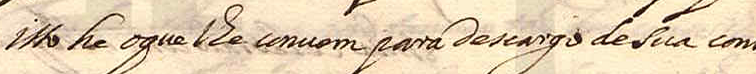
isso he o que lhe conuem para descargo de sua cons_
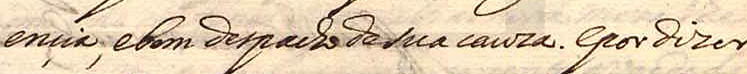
ençia, e bom despacho de sua cauza. e por dizer
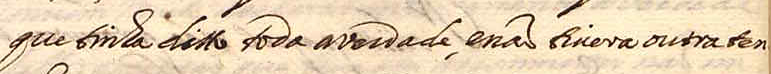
que tinha ditto toda a verdade, e não tiuera outra ten
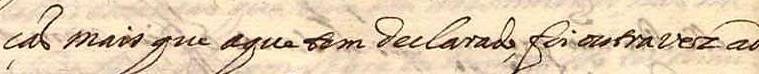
ção mais que a que tem declarado, foi outra vez ad
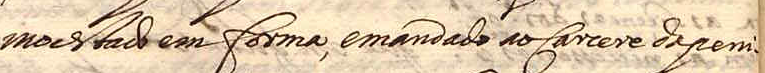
moestado em forma, e mandado ao Carcere da peni
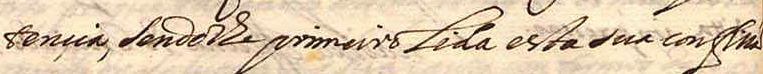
tençia, sendolhe primeiro Lida esta sua confissa
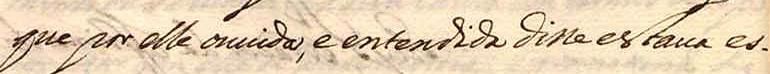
que por elle ouuida, e entendida disse estaua es
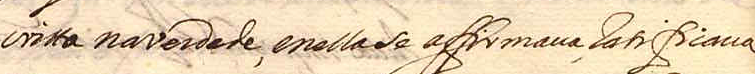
critta na verdade, e nella se affirmaua, Ratificaua
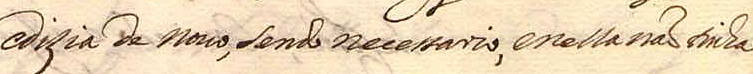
e dizia de nouo, sendo necessario, e nella não tinha
